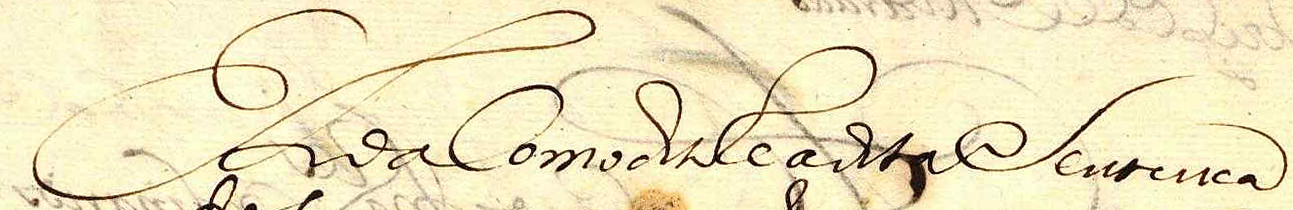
E Lida Como dito he a dita Sentença
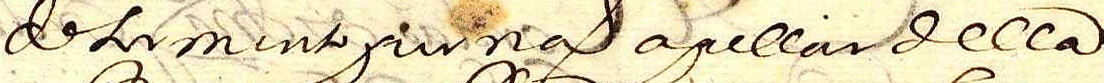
do tormento por naõ apellar della
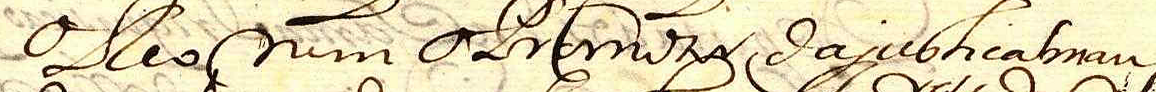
o Reo nem o Promotor da justiça man
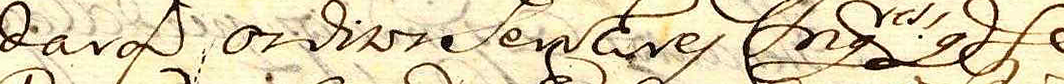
daraõ os ditos senhores Inq.res q̄ se
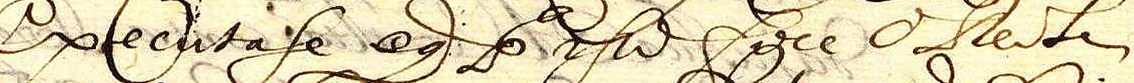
executase e q̄ pa isso foçe o Reo Le
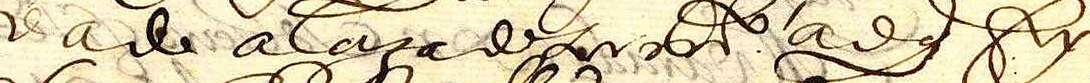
vado a Caza do torm.to ao q̄ foy
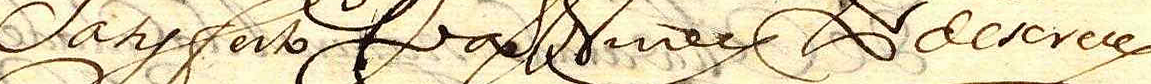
Satisfeito Joaõ Nunes Xer o escreuj
